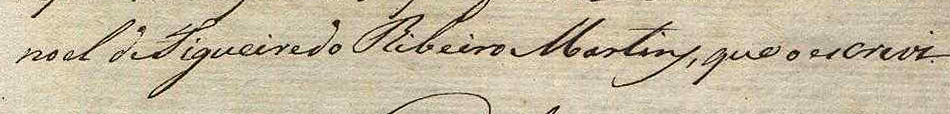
noel de Figueiredo Ribeiro Martins, que o escrevi.
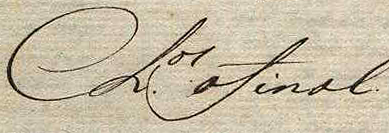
CL.os afinal.
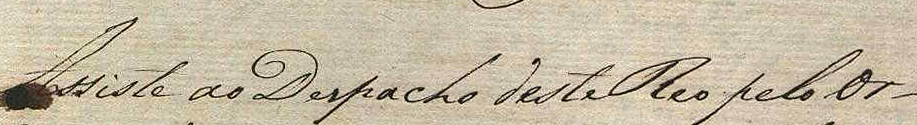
Assiste ao Despacho deste Reo pelo or
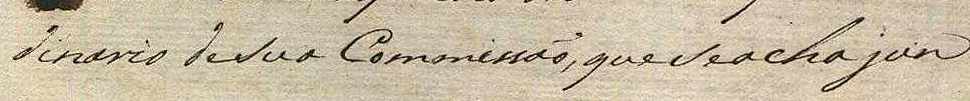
dinario de sua Commissaõ, que se acha jun
